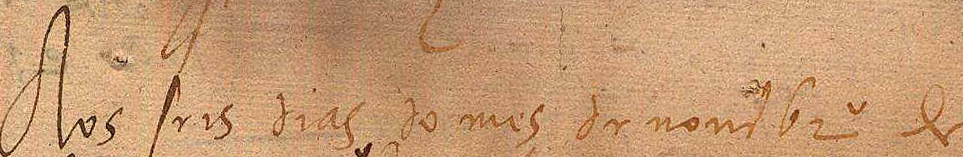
Aos seis dias do mes de nouēbro de
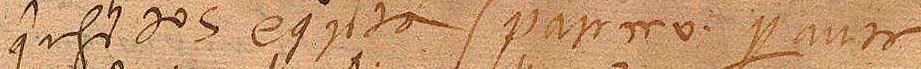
qinhētos e qorētestemunha / pareçeo. ꝑante
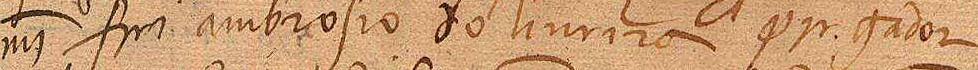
m̄j frei ambrosio doliueira pregador
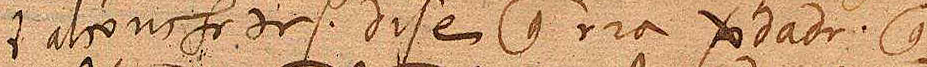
ē alcouchete /. dise q̄ era ꝟdade. q̄
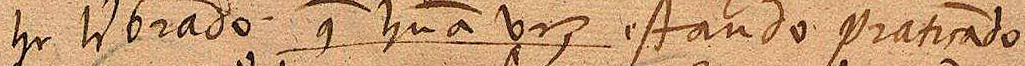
he lēbrado. q̄ hūa vez estando pratic̄ado
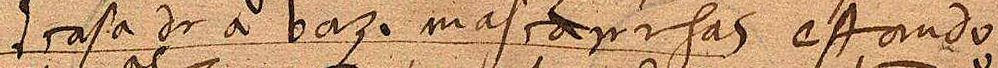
ē casa de ao vaz. mascarenhas estando
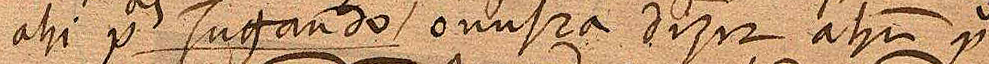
ahi pas Jugando / ouujra dizer a hū po
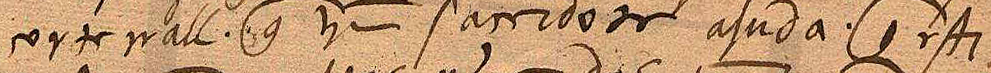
corte reall. q̄ hū saçerdote ajnda . q̄ esti
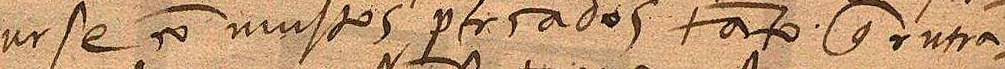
uese c̄o mujtos pecados tāto. q̄ entra
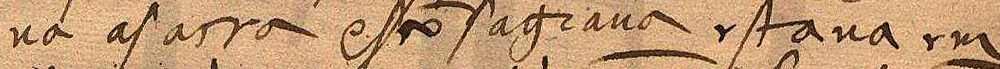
ua a sacra e scōsagraua estaua em
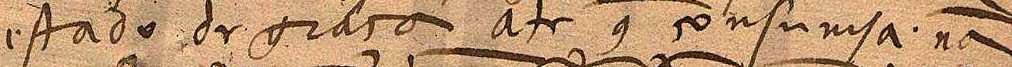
estado de graça ate q̄ consumja. n̄a
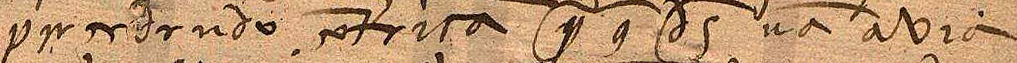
preçedendo c̄otriç̄a p̄oq̄ d̄s nā avia
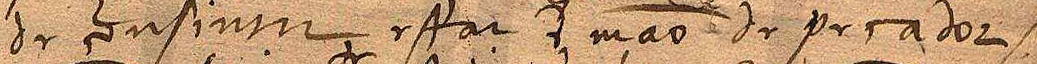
de consintir estar ē mão de pecador/
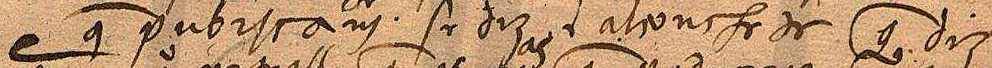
e q̄ pubrjcamte. se diz ē alcouchete q̄ dis
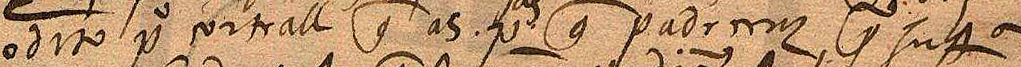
o dito po corteall q̄ as. pas. q̄ padeçem p̄o Justa
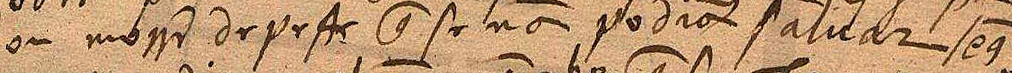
ou morrē de peste q̄ se nā podiā saluar / e q̄
